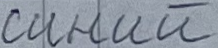синий
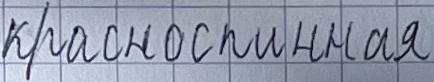красноспинная
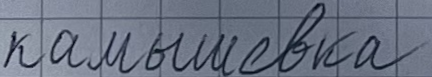камышевка
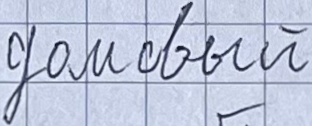домовый
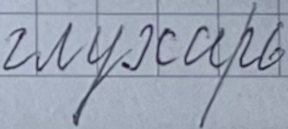глухарь
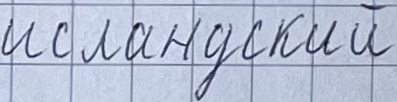исландский
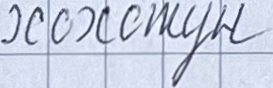хохотун
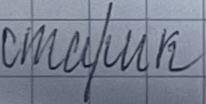старик
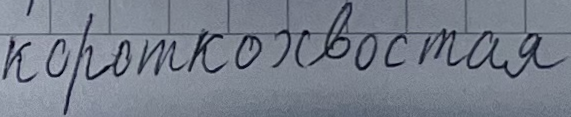короткохвостая
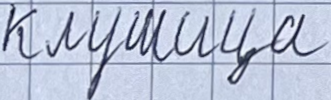клушица
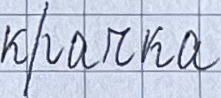крачка
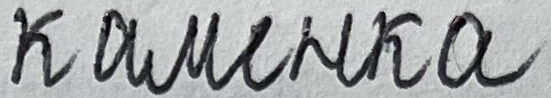каменка
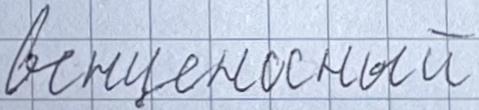венценосный
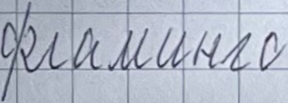фламинго
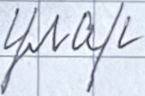улар
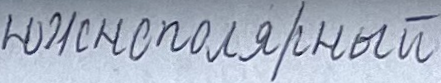южнополярный
